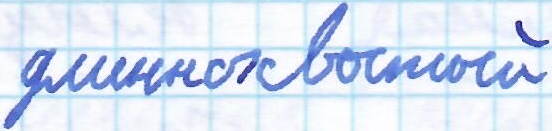длиннохвостый
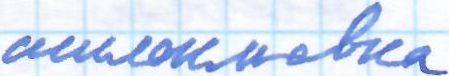шилоклювка
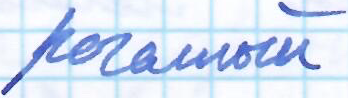рогатый
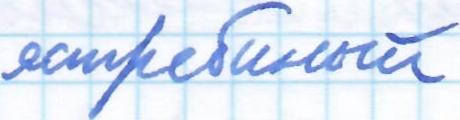ястребиный
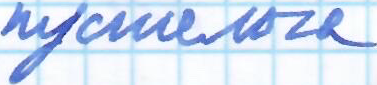пустельга
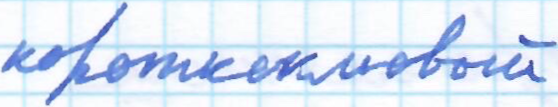короткоклювый
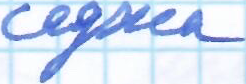саджа
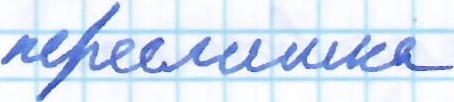пересмешка
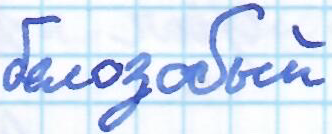белозобый
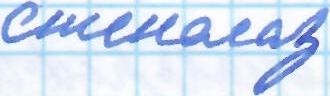стенолаз
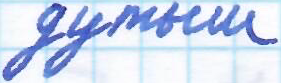дутыш
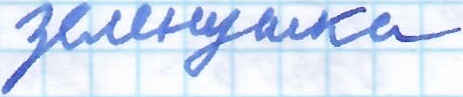зеленушка
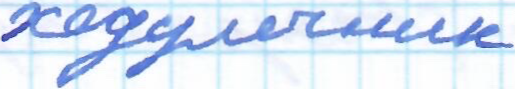ходулочник
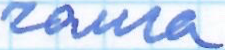чомга
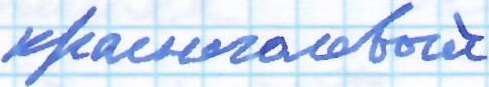красноголовый
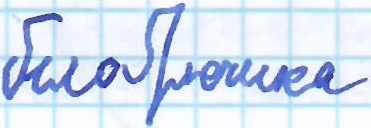белобрюшка
